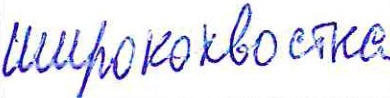широкохвостка
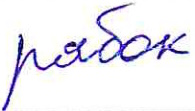рябок
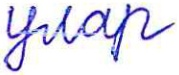улар
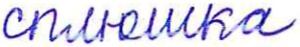сплюшка
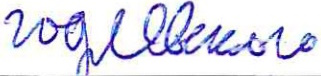годлевского
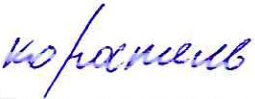коратель
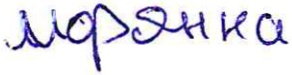морянка
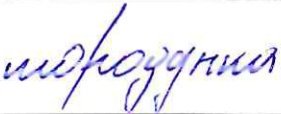мородунка
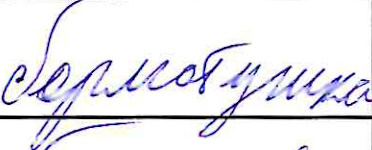бормотушка
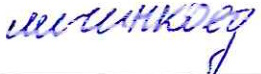личинкоед
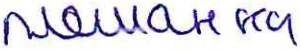плешанка
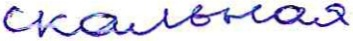скальная
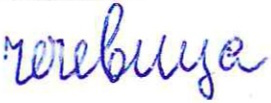чечевица
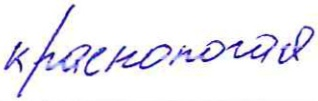красноногая
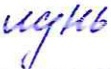лунь
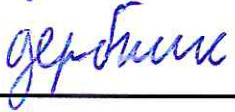дербник
